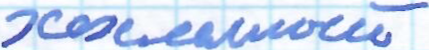хохлатый
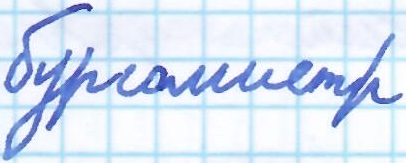бургомистр
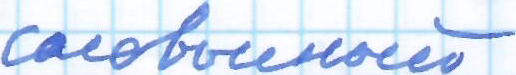соловьиный
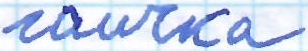гаичка
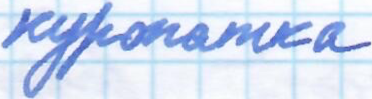куропатка
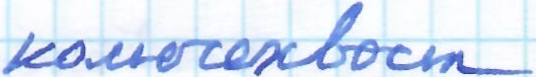колючехвост
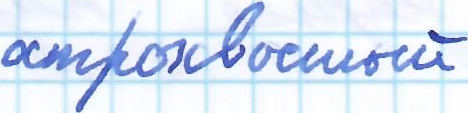острохвостый
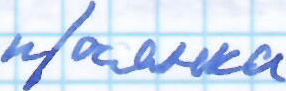просянка
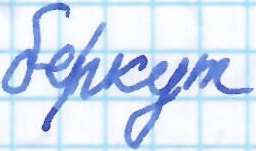беркут
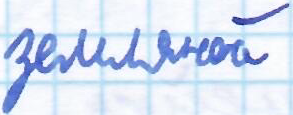земляной
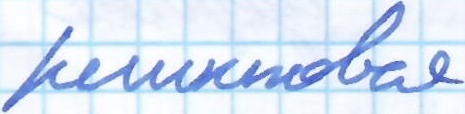реликтовая
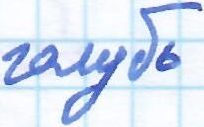голубь
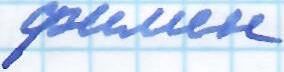филин
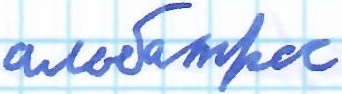альбатрос
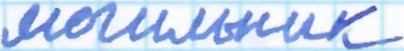могильник
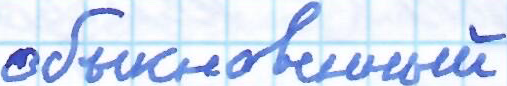обыкновенный
